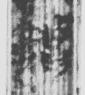饋
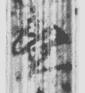鬯
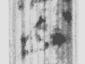㠯（以）
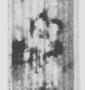{斤心}
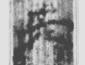亓
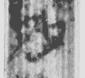多
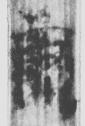福
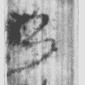乃
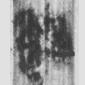即
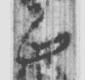㠯（以）
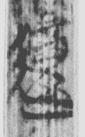復
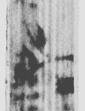之
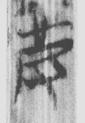皮
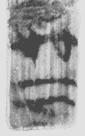{廿廿二}
